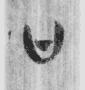口
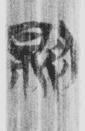則
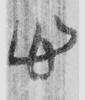心
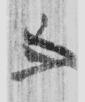之
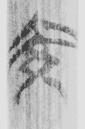{宀交}
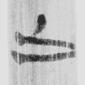止
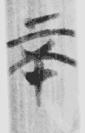不
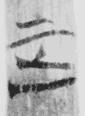正
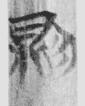則
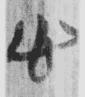心
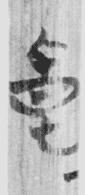卓
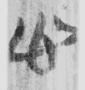心
